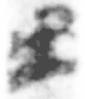爲
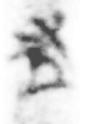○（右）
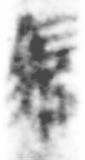○（服）
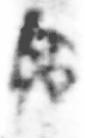高
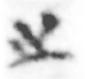之
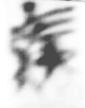駟
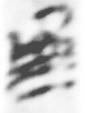爲
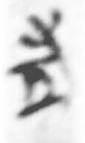○（右）
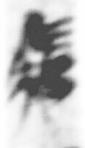驂
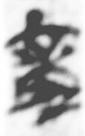𨍱（乘）
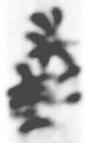○（廣）
